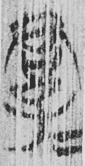君子
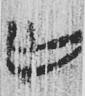無
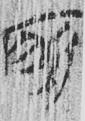所
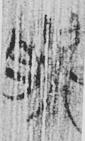○（厭）
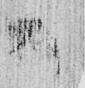人
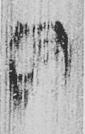含（今）
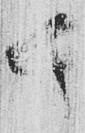女（汝）
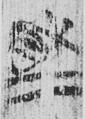相
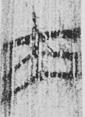夫
